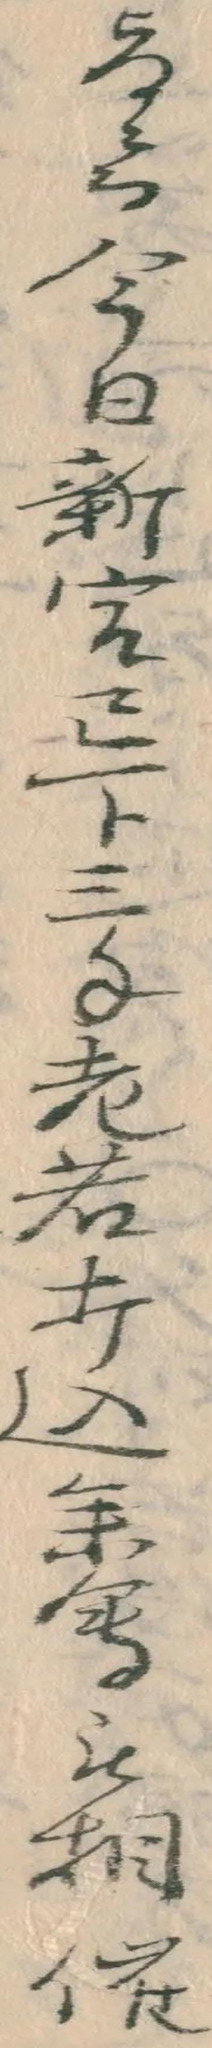旨ニ而今日新宮已下三手老若打込参會被相催
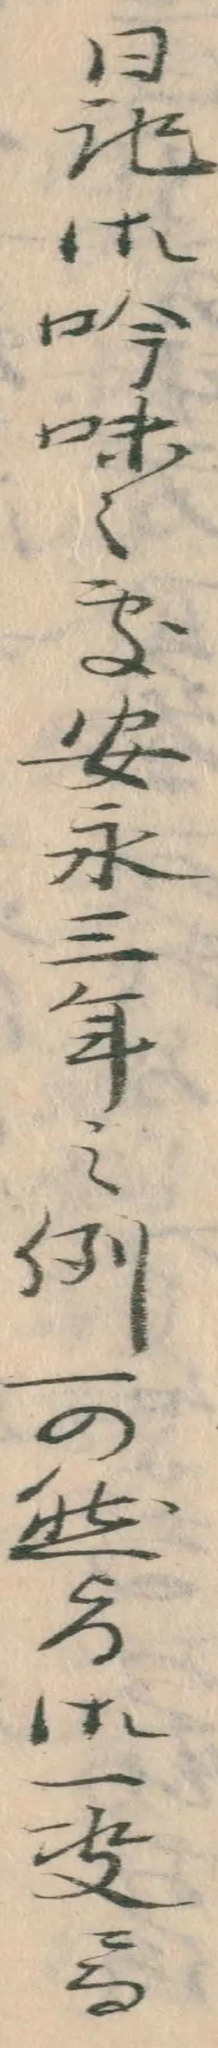日記御吟味之處安永三年之例可然旨御一決ニ而
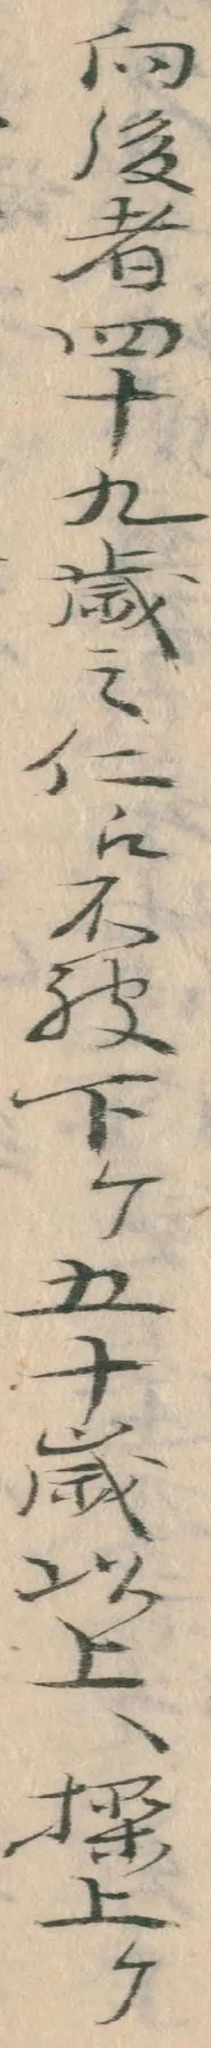向後者四十九歳之仁え不被下ケ五十歳以上へ操上ケ
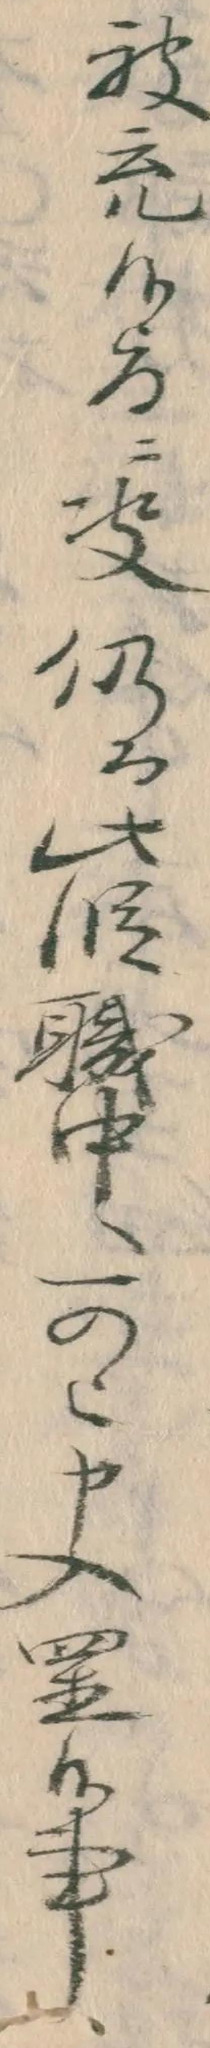被充候旨ニ決仍而此段職中へ可被申入置候事
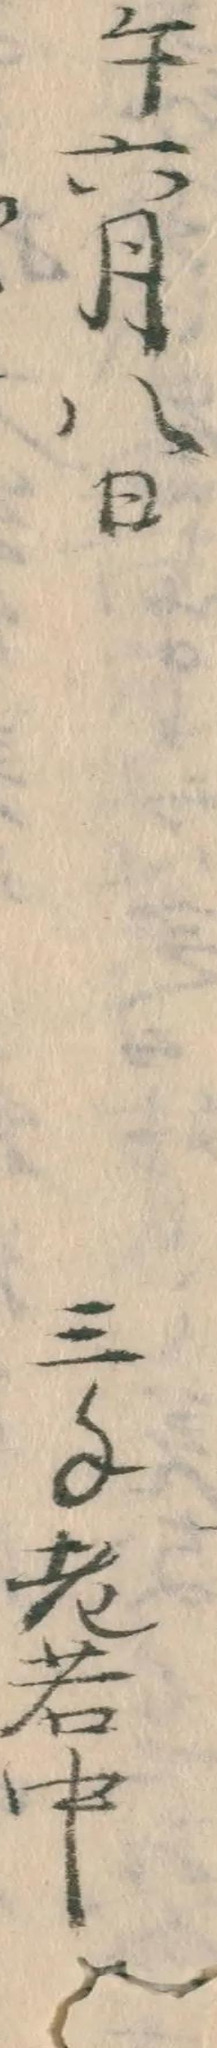午六月八日三手老若中
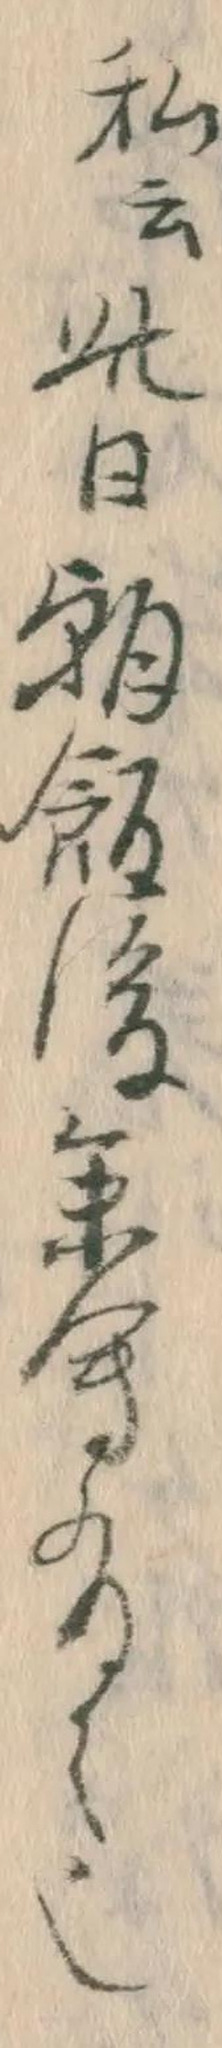私云此日朝飯後参會有之也
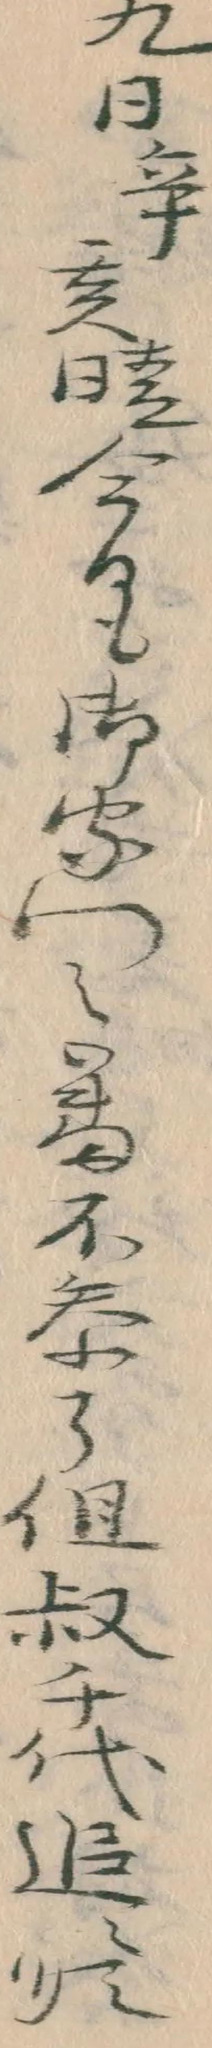九日辛亥晴今日も御家門之番不参了但叔千代追々順
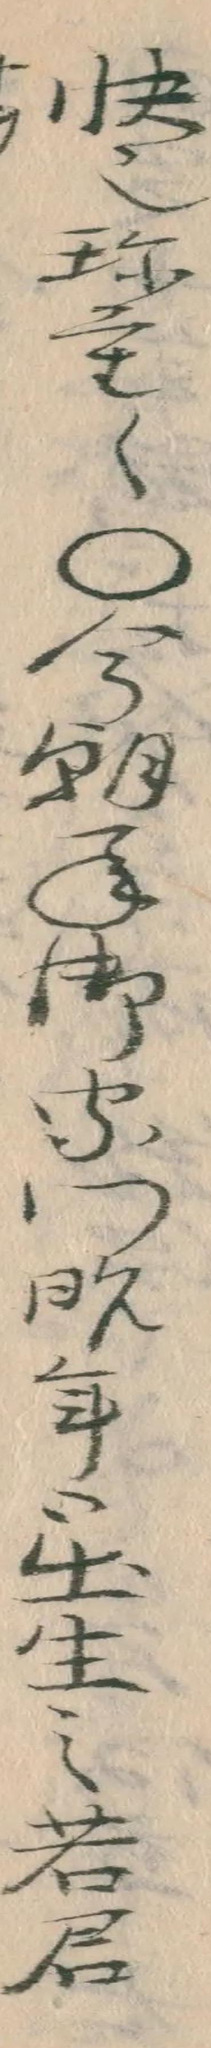快也珍重〳〵○今朝承御家門昨年御出生之若君
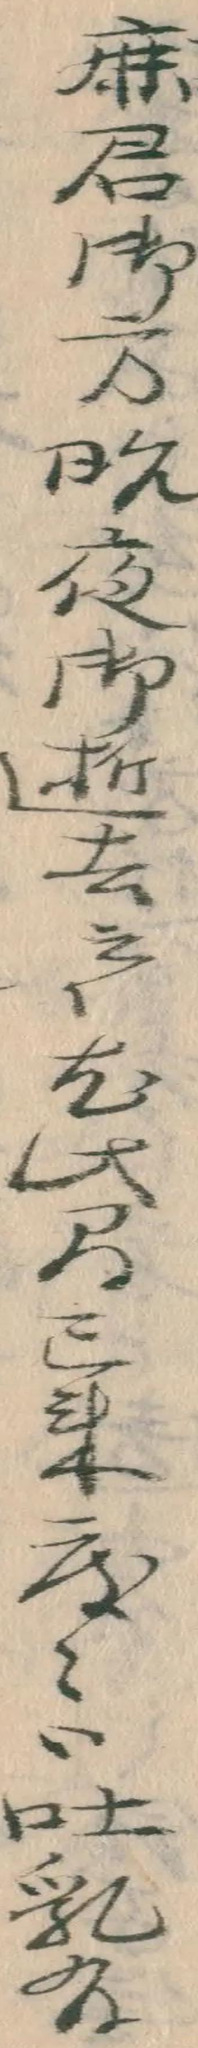鹿君御方昨夜御逝去云々尤此間已来度々御吐乳有
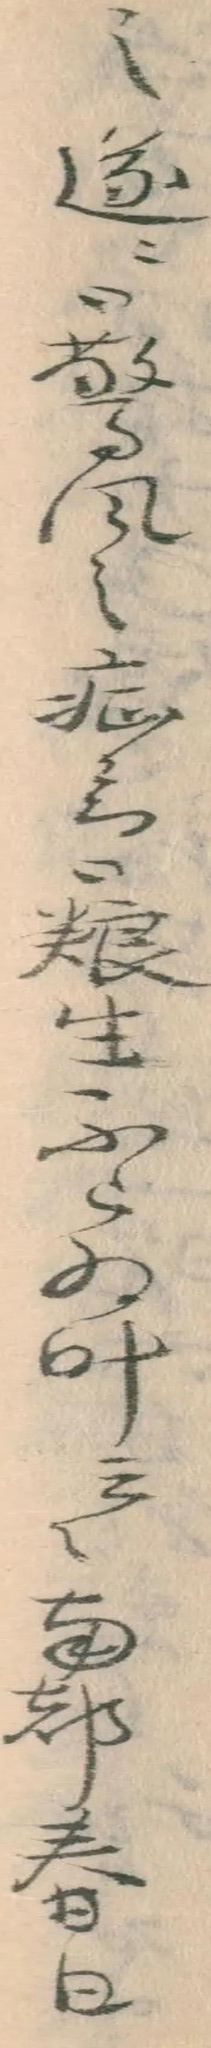之遂ニ御驚風之症ニ而御養生不被為叶云々南都春日
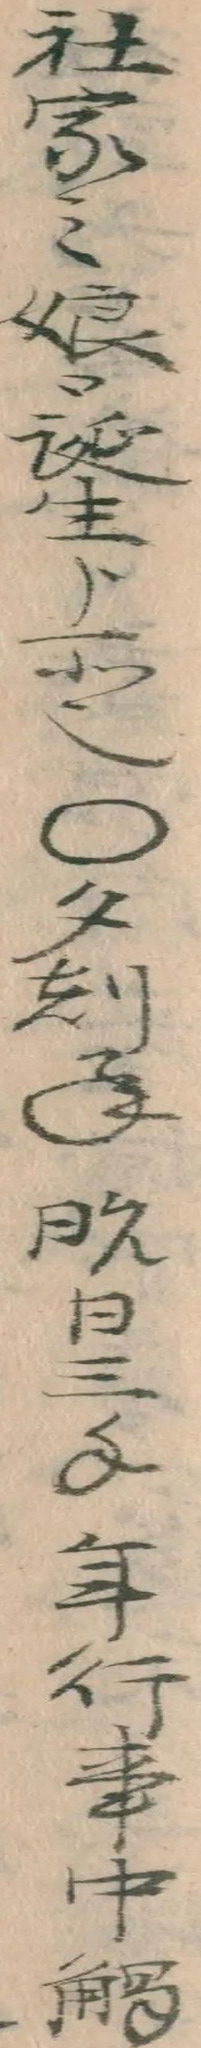社家之娘御誕生ト所也○夕刻承晩日三手年行事中触
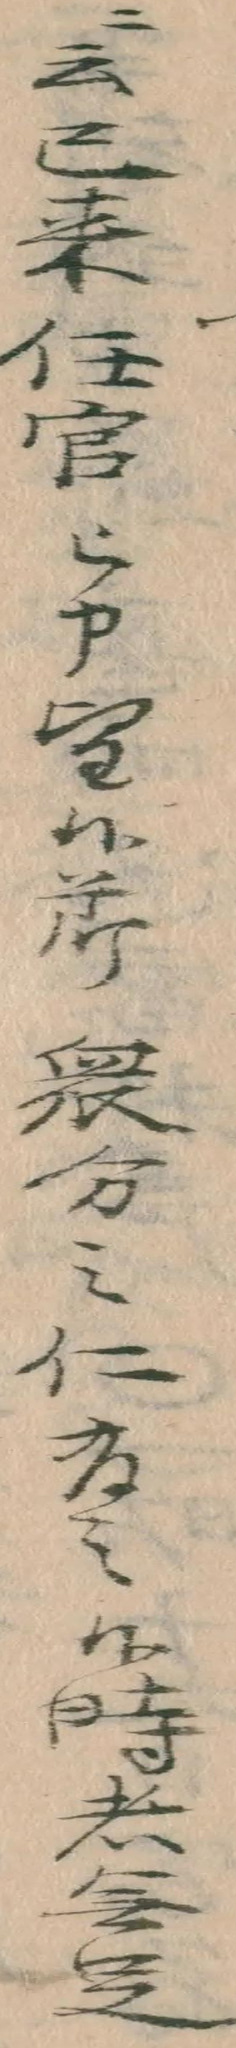ニ云已来任官被申望候節衆分之仁有之候時者無足
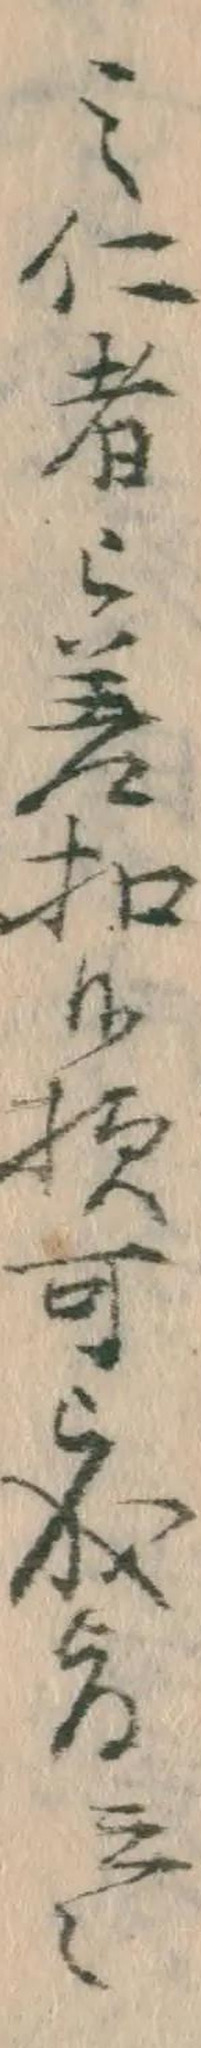之仁者被差扣候様可被成旨云々
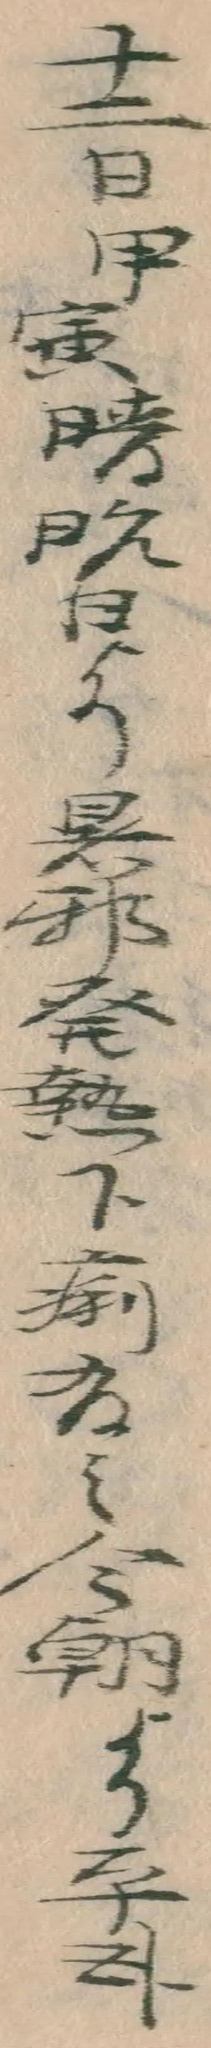十二日甲寅晴晩日より暑邪発熱下痢有之今朝より平臥
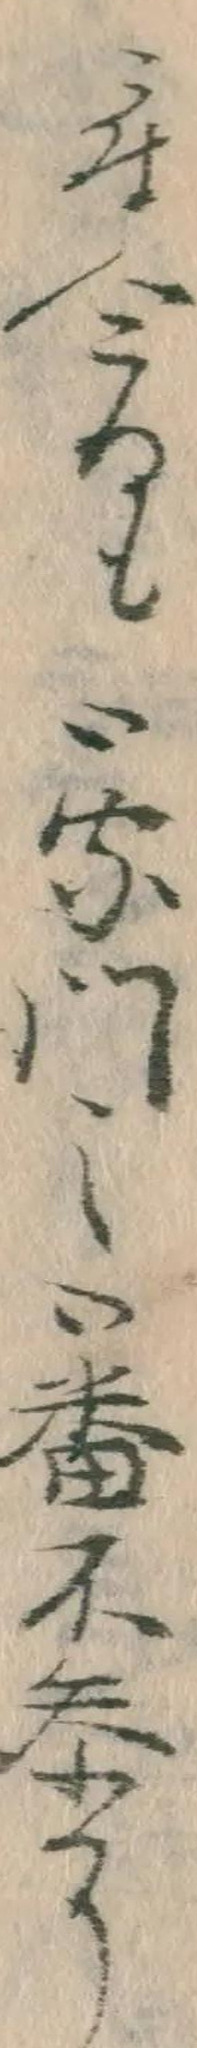ニ付今日も御家門之御番不参了
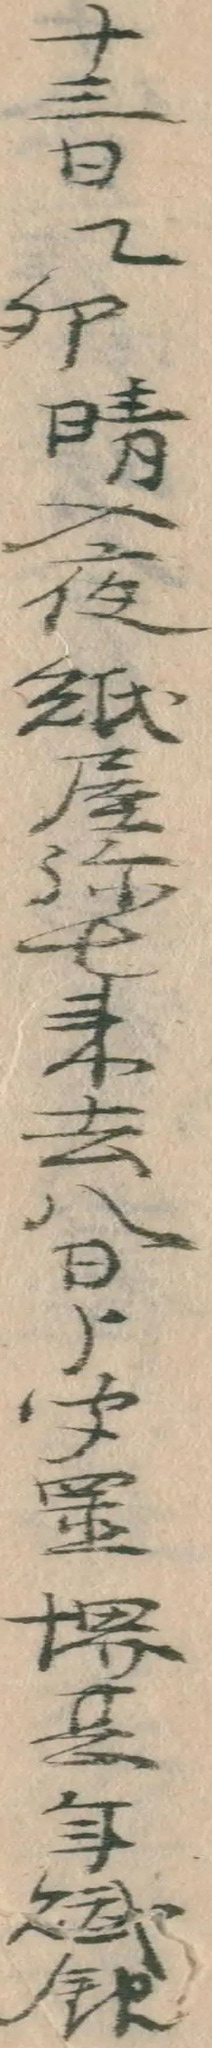十三日乙卯晴入夜紙屋弥七来去八日申聞置堺甚年賦銀
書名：賀茂社記録. 第63冊
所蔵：国立国会図書館 National Diet Library, JAPAN
